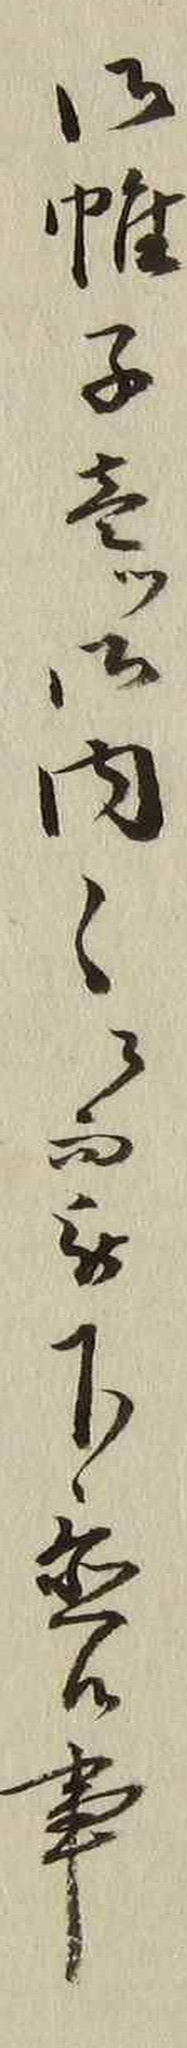御帷子壱ツ御内々ニ而被下置候事
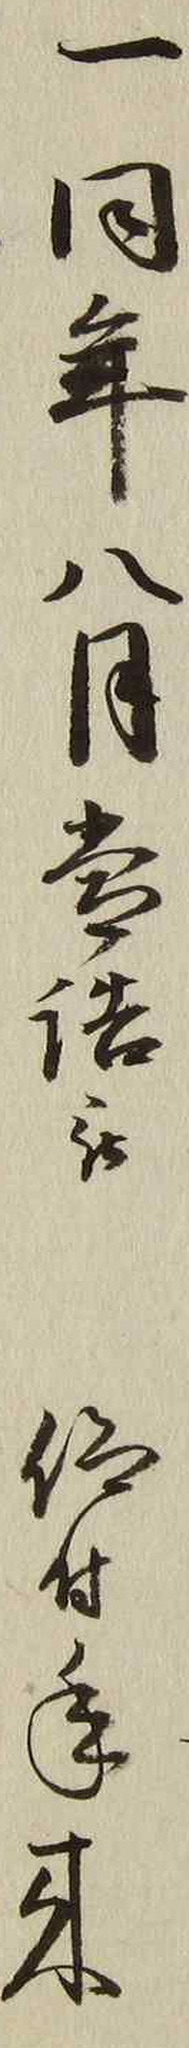一同年八月常詰被仰付年来
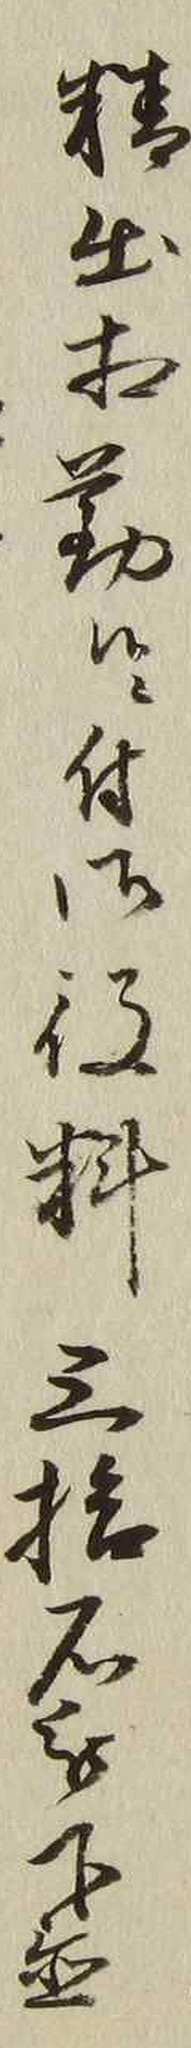精出相勤候ニ付御役料三拾石被下置
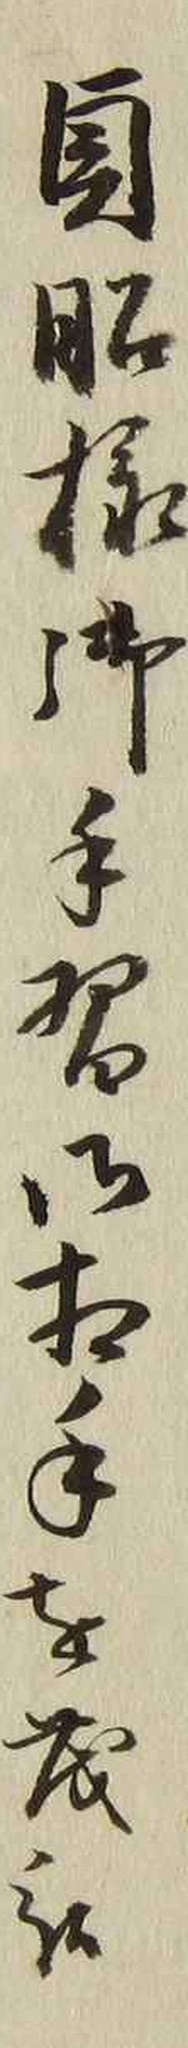貞昭様御手習御相手をも被
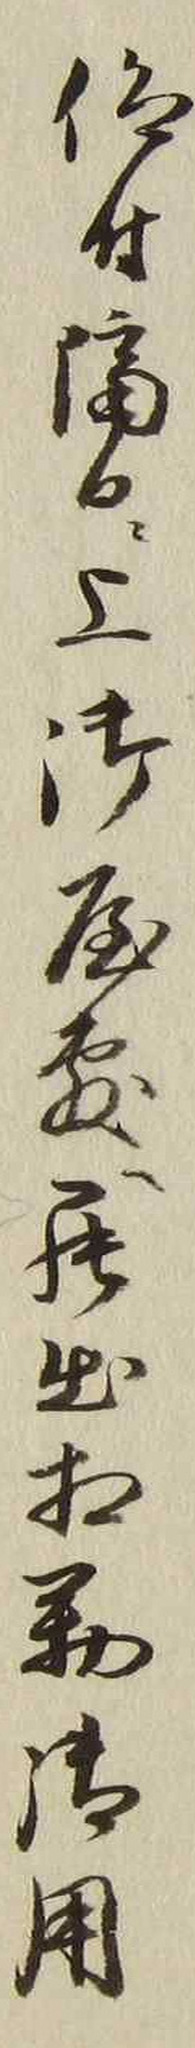仰付隔日ニ上御屋敷へ罷出相勤御用
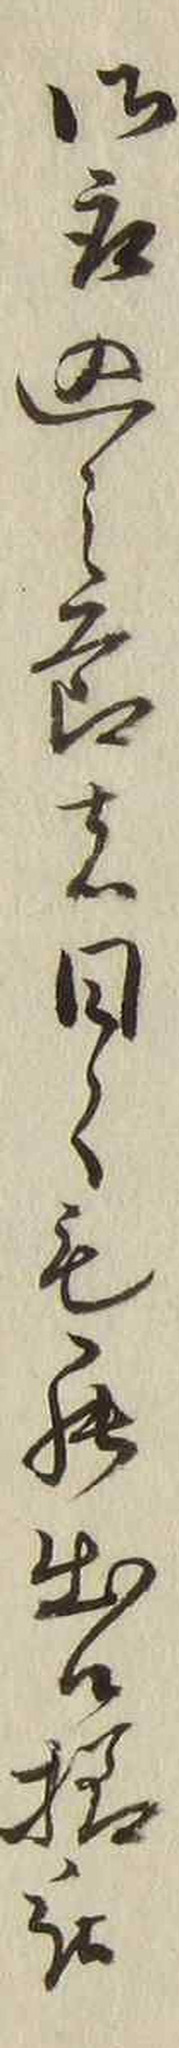御取込之節者日々も罷出候様被

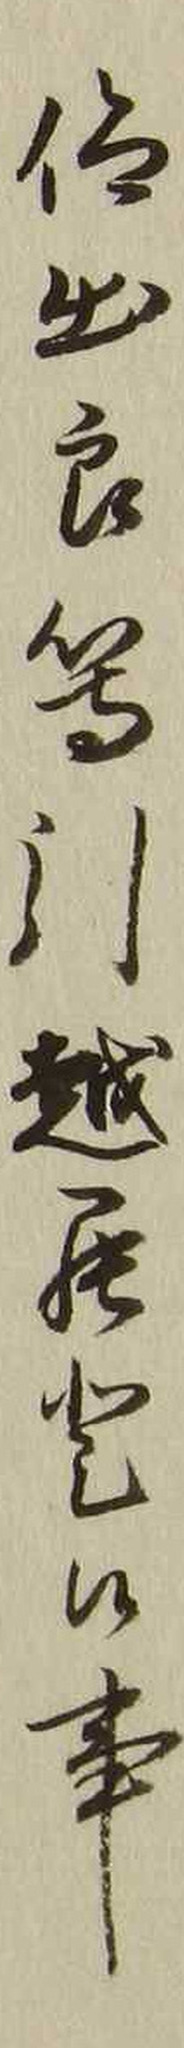仰出郎等引越罷登候事
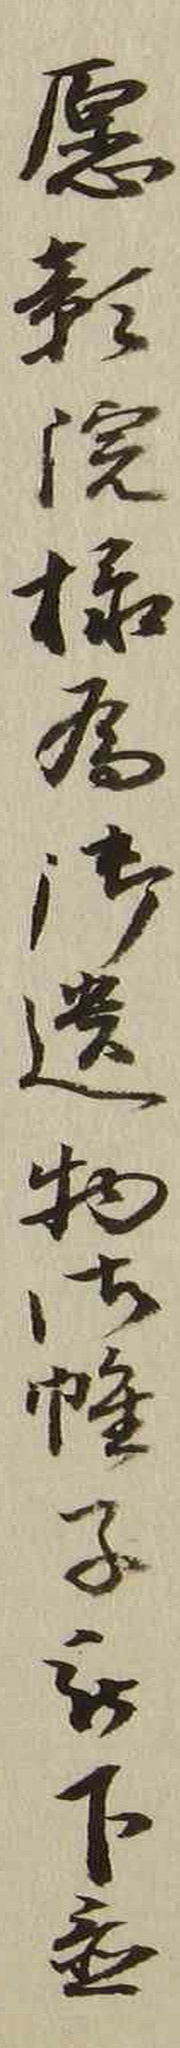愿彰院様為御遺物御帷子被下置
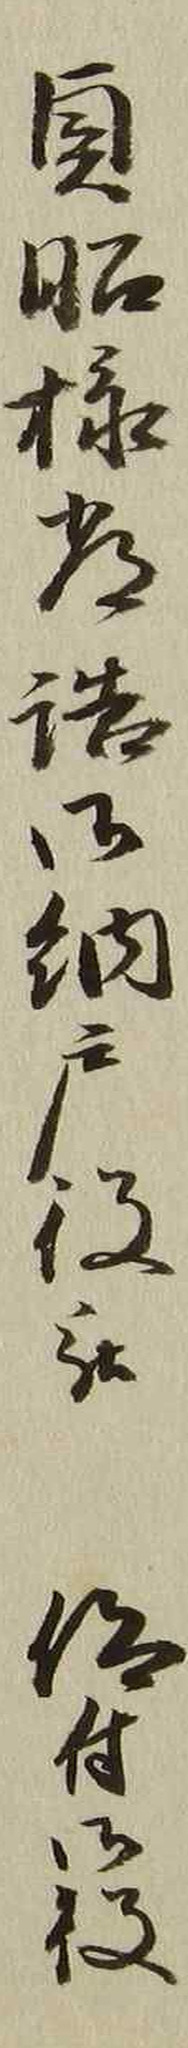貞昭様常詰御納戸役被仰付御役
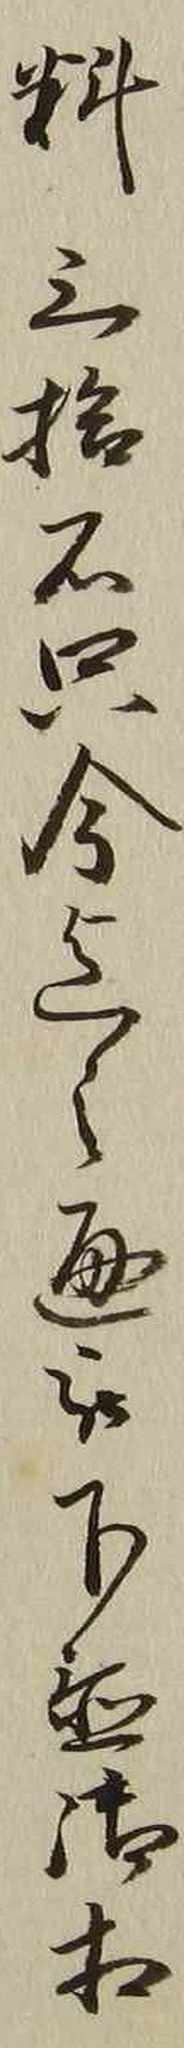料三拾石只今迄之通被下置御相
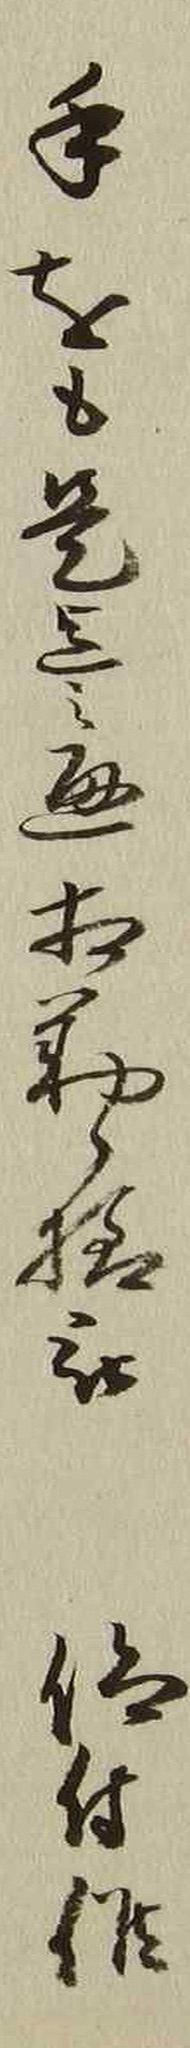手をも是迄之通相勤之様被仰付候
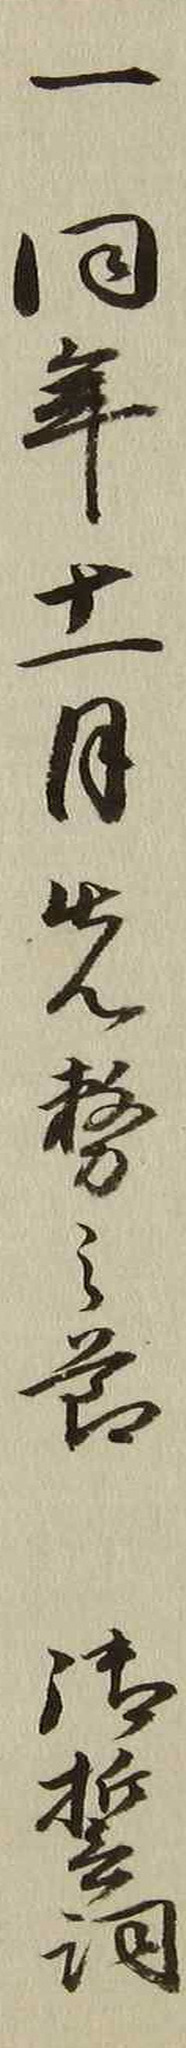一同年十一月先務之節御誓詞
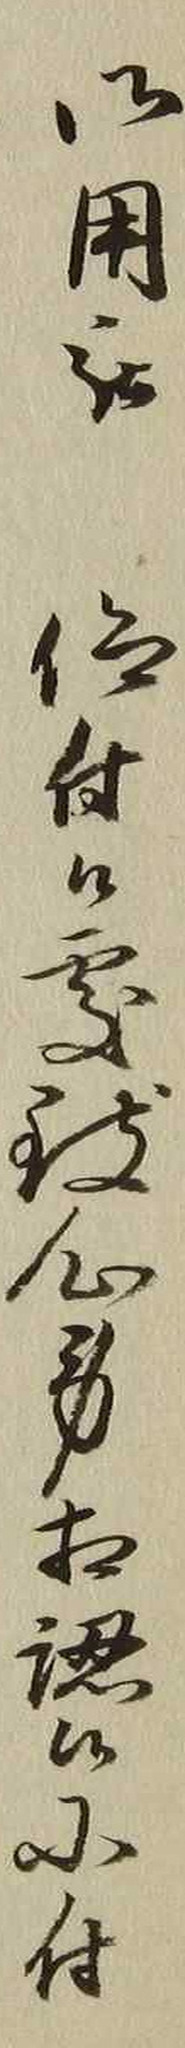御用被仰付候処致心労相認候に付
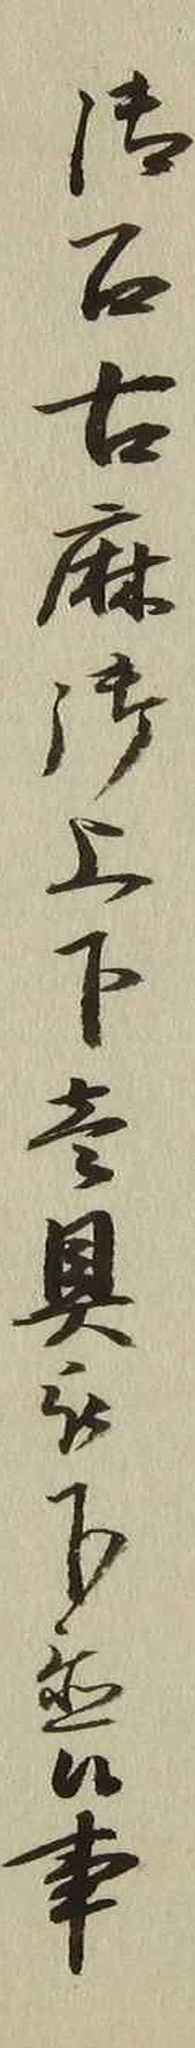御召古麻御上下壱具被下置候事
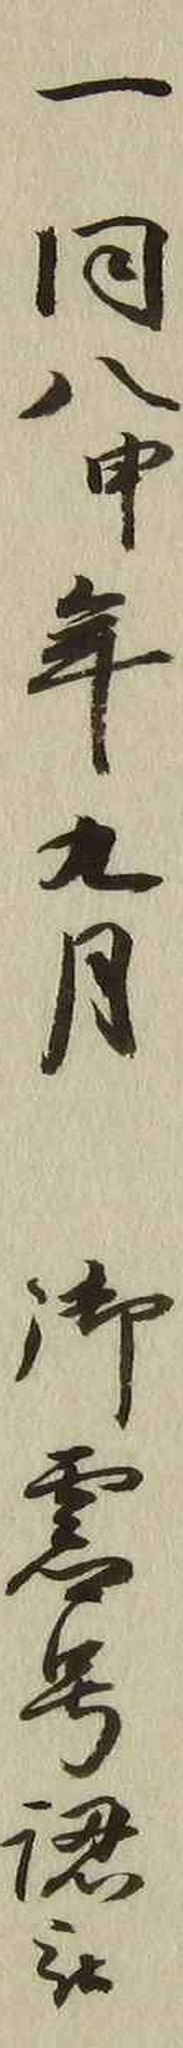一同八申年九月御霊号認被
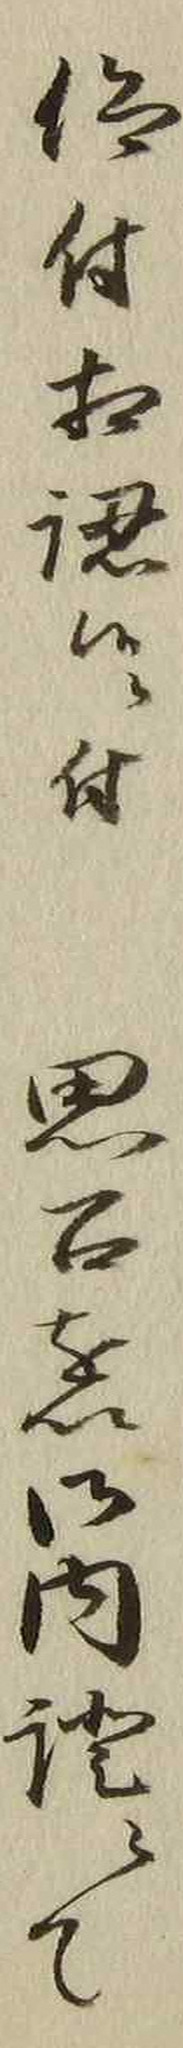仰付相認候ニ付思召を以御内証ニて
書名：諸士系譜　巻之61　と之部4
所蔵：会津若松市立会津図書館
